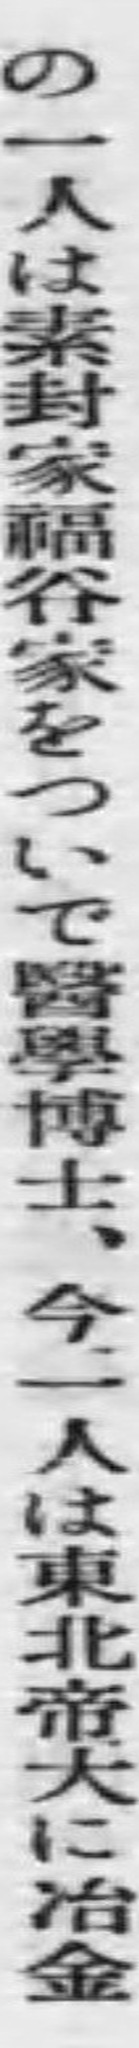の一人は素封家福谷家をついで医学博士、今一人は東北帝大に冶金
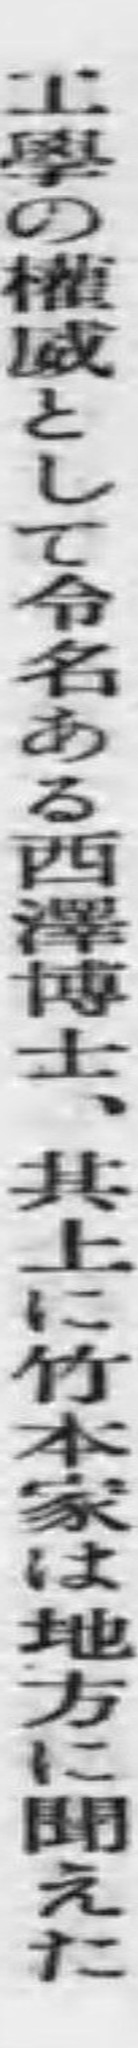工学の権威として令名ある西沢博士、其上に竹本家は地方に聞えた
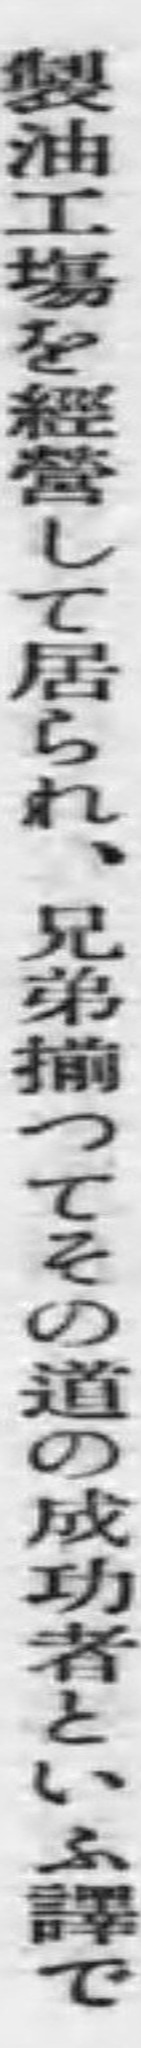製油工場を経営して居られ、兄弟揃つてその道の成功者という訳で
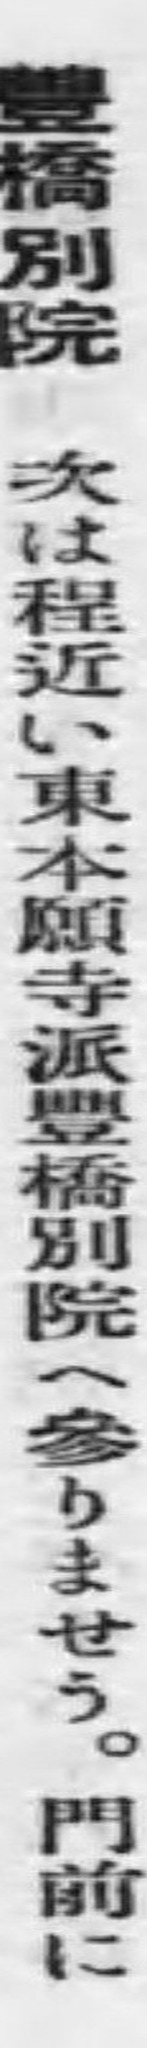豊橋別院次は程近い東本願寺派豊橋別院へ參りませう。門前に
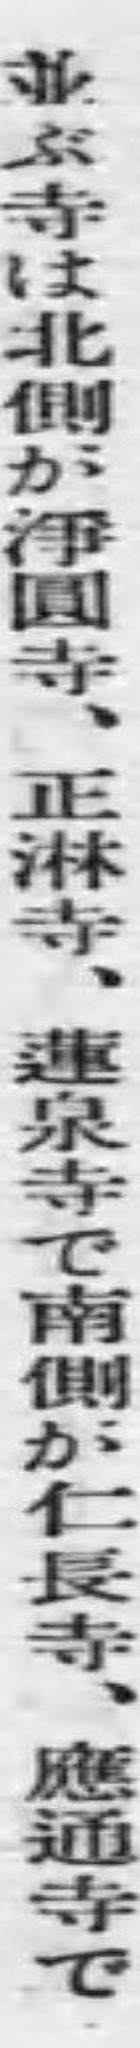並ぶ寺は北側が浄円寺、正淋寺、蓮泉寺で南側が仁長寺、応通寺で
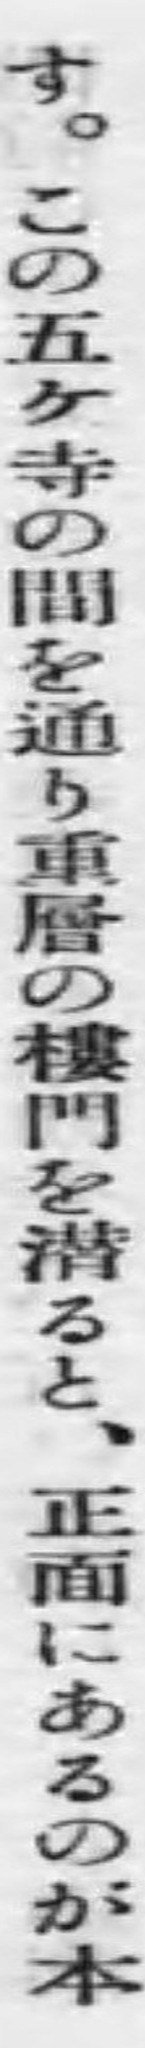す。この五ヶ寺の間を通り重層の楼門を潜ると、正面にあるのが本
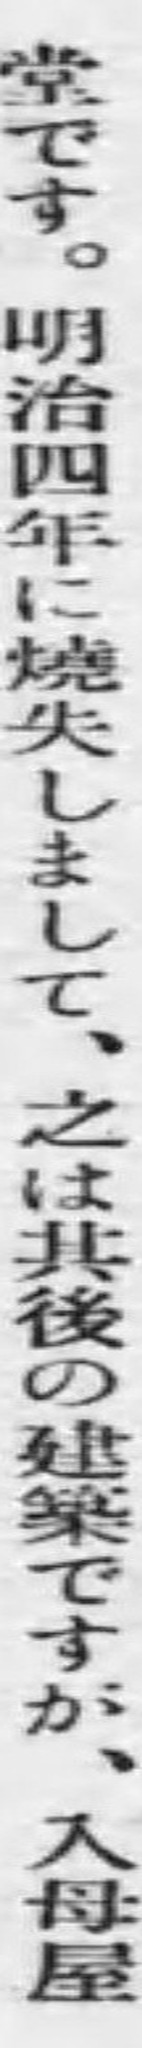堂です。明治四年に焼失しまして、之は其後の建築ですが、入母屋
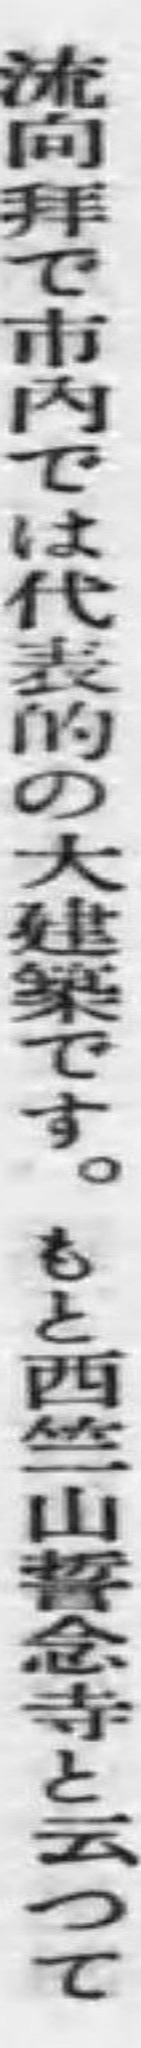流向拝で市内では代表的の大建築です。もと西竺山誓念寺と云つて
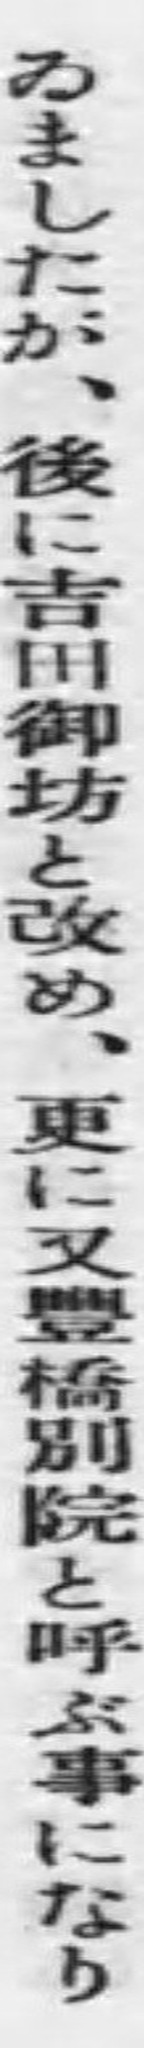ゐましたが、後に吉田御坊と改め、更に又豊橋別院と呼ぶ事になり
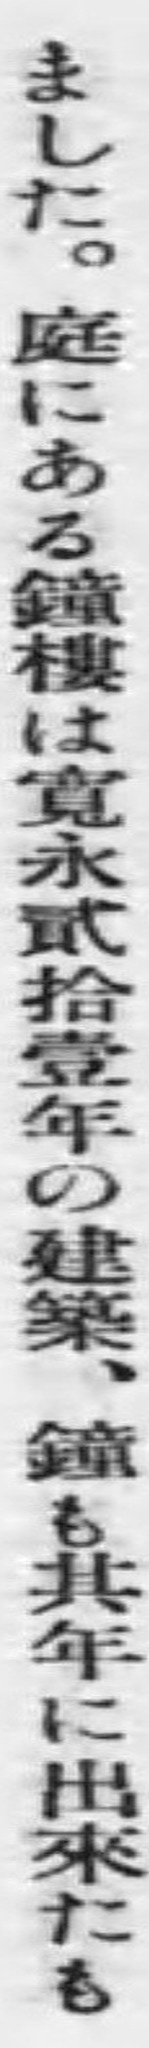ました。庭にある鐘楼は寛永弐拾壱年の建築、鐘も其年に出来たも

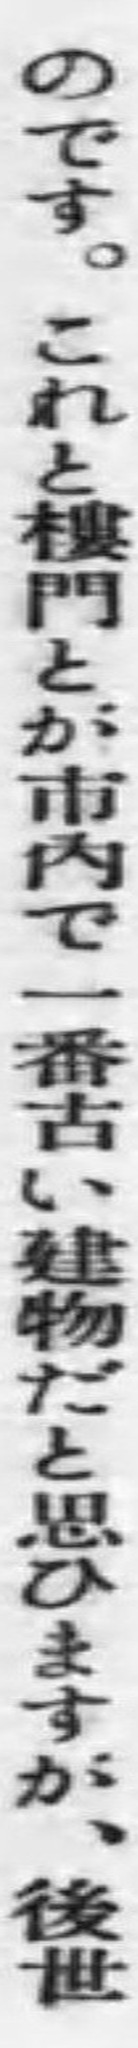のです。これと楼門とが市内で一番古い建物だと思ひますが、後世
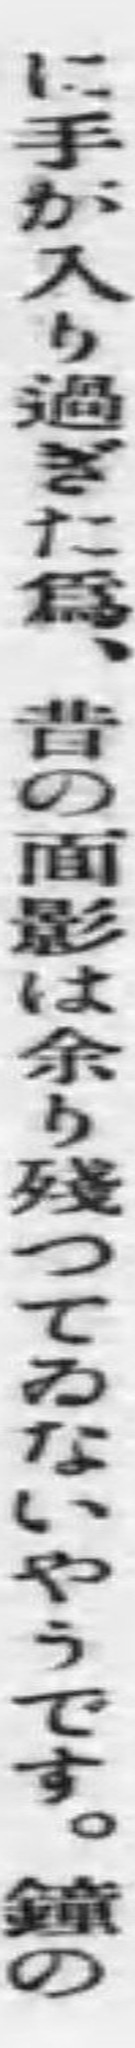に手が入り過ぎた為、昔の面影は余り残つてゐないやうです。鐘の
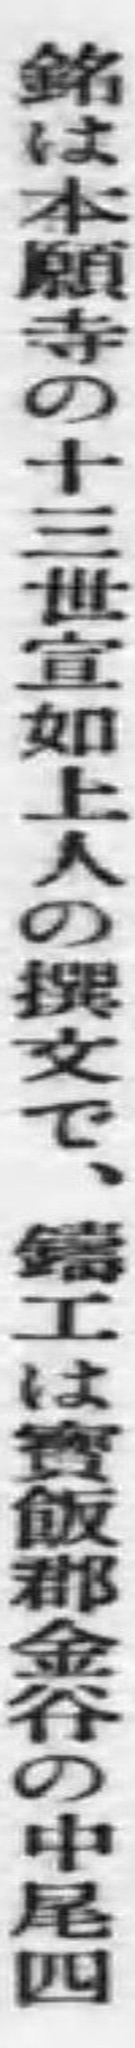銘は本願寺の十三世宣如上人の撰文で、鋳工は宝飯郡金谷の中尾四
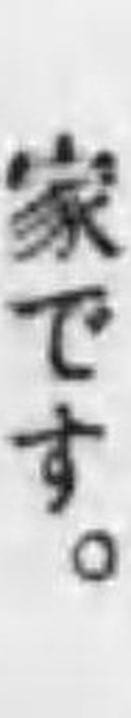家です。
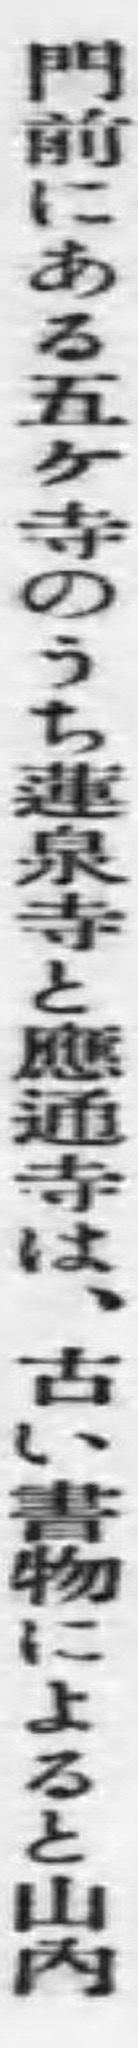門前にある五ヶ寺のうち蓮泉寺と応通寺は、古い書物によると山内
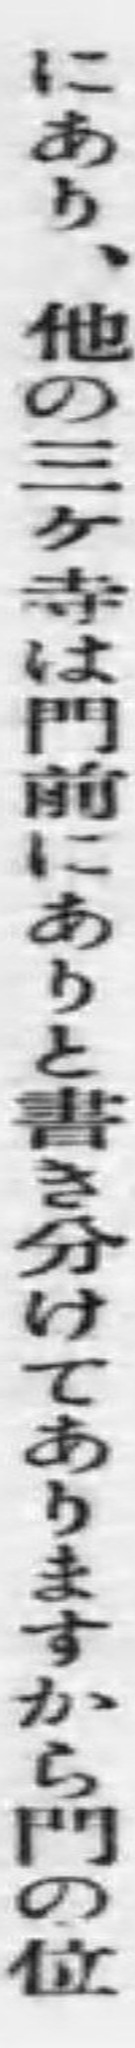にあり、他の三ヶ寺は門前にありと書き分けてありますから門の位
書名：東三河道中記 : 豊橋市及其附近案内
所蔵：国立国会図書館 National Diet Library, JAPAN
